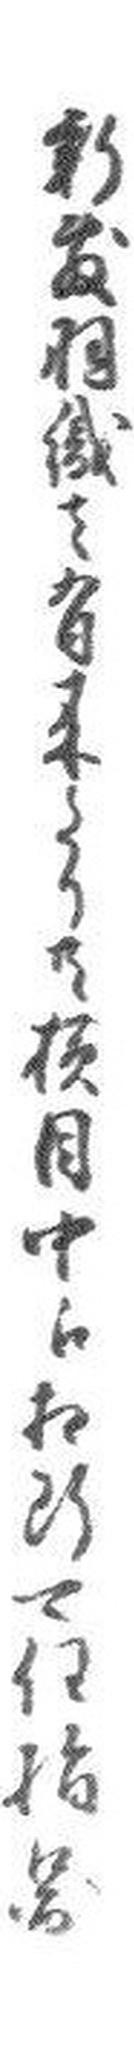新敷羽織は有来たり共横目中江相断可任指図
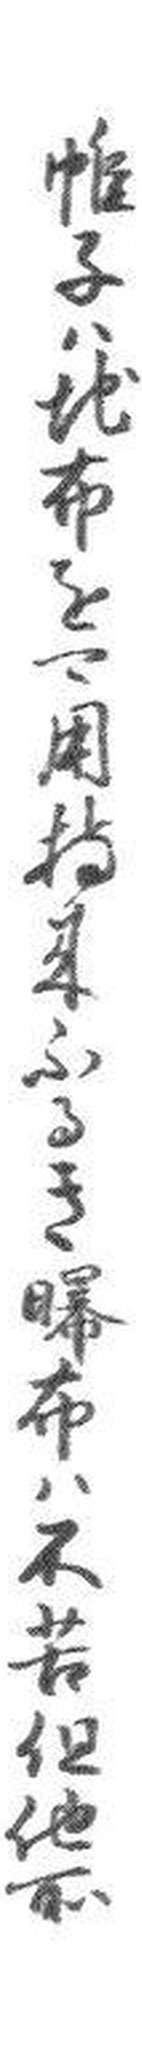帷子ハ地布を可用持来ふるき曝布ハ不苦但他所
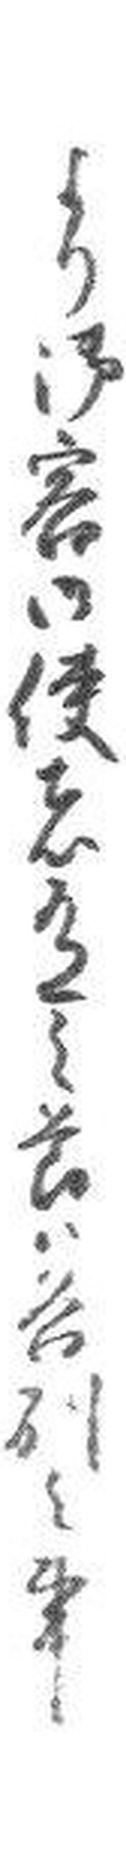より御客御使者有之節ハ各別之事
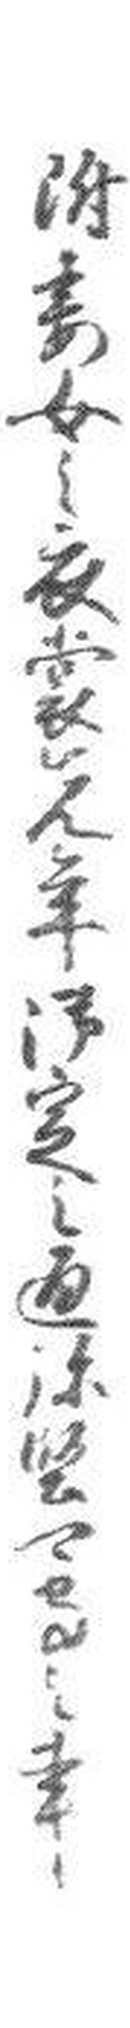附妻女之衣裳先年御定之通弥堅守之事
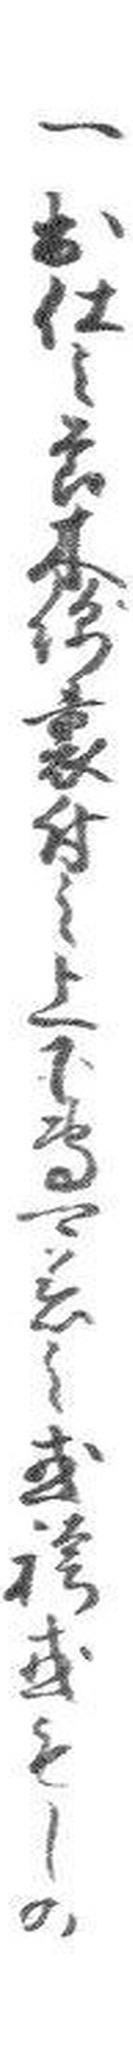一出仕之節木綿裏付之上下専可着之或袴或もしの
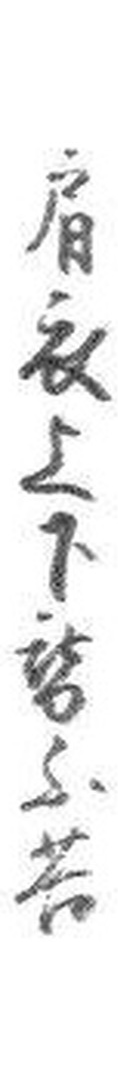肩衣上下替不苦
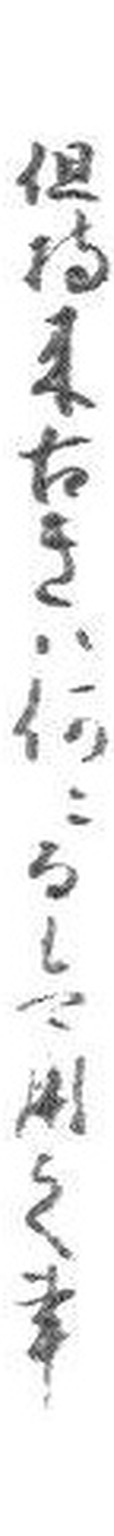但持来古きハ何ニ而も可用之事
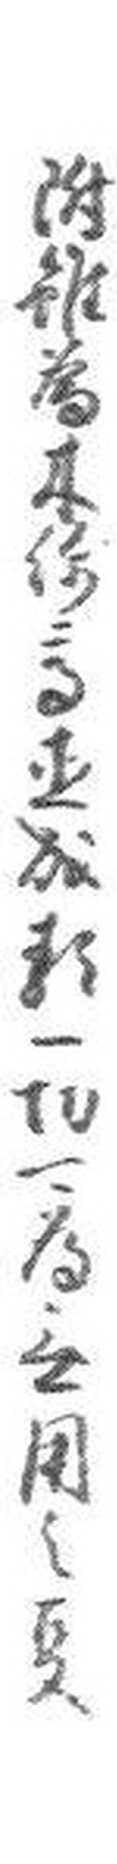附雖為木綿高直成類一切可為無用之事
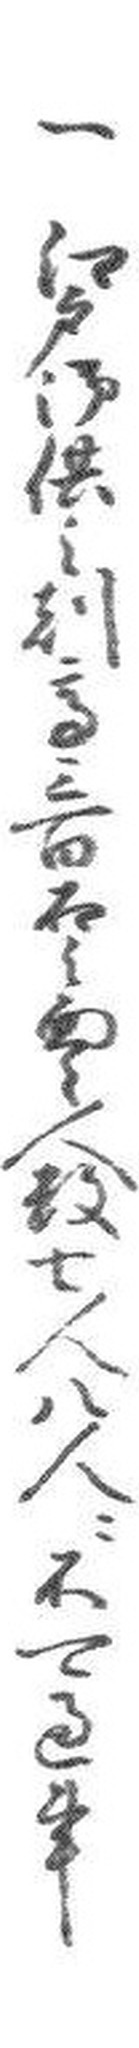一江戸御供之刻高三百石之面々人数七人八人ニ不可過事

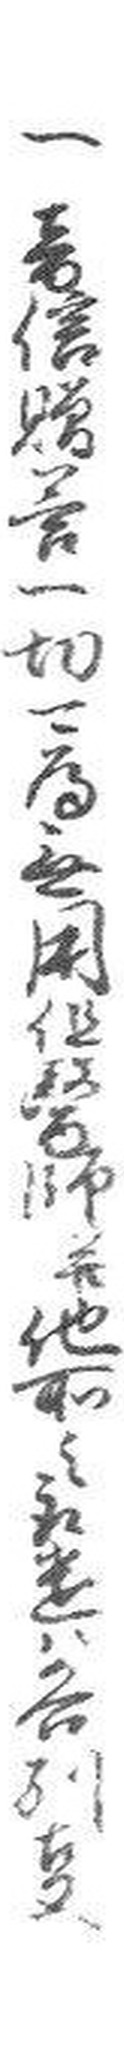一音信贈答一切可為無用但医師并他所之取遣ハ各別事
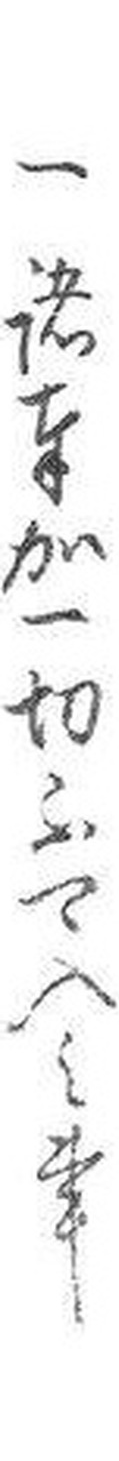一諸奉加一切不可入之事
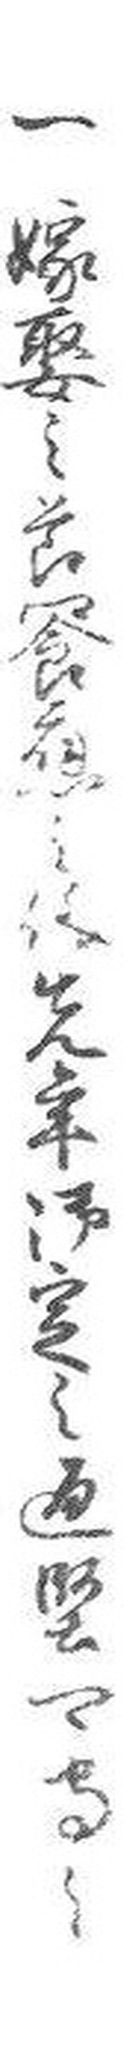一嫁娶之節饗応之儀先年御定之通堅可守之
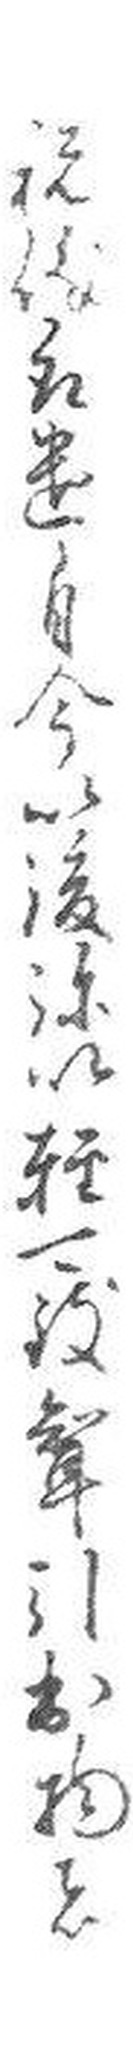祝儀取遣自今以後弥以軽可致聟引出物者
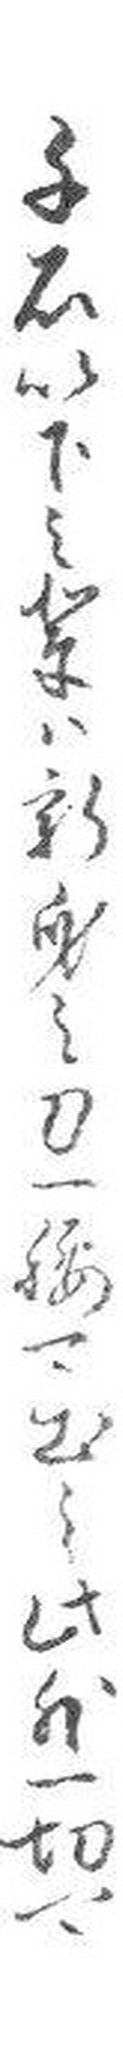千石以下之輩ハ新身之刀一腰可出之此外一切可
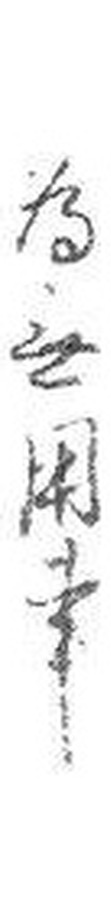為無用事
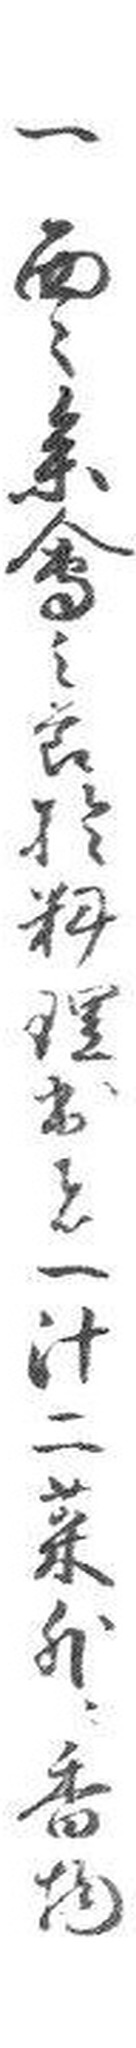一面々参会之節於料理出者一汁二菜外ニ香物
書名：家譜 七 光通公 従寛文四年到同九年
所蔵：福井県文書館 Fukui Prefectural Archives
